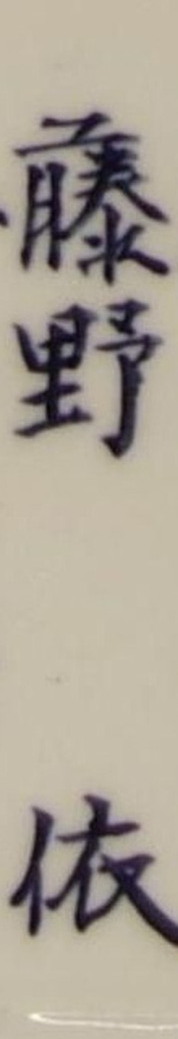藤野依
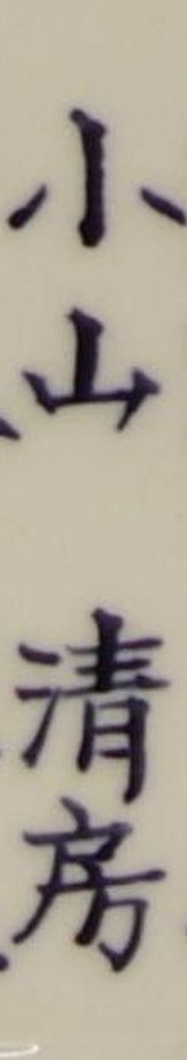小山清房
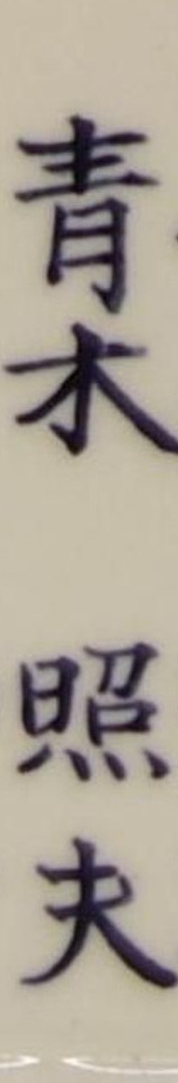青木照夫
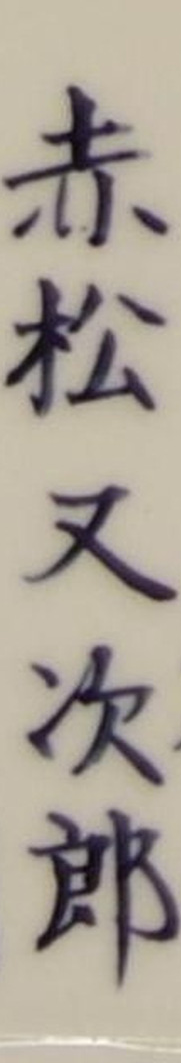赤松又次郎
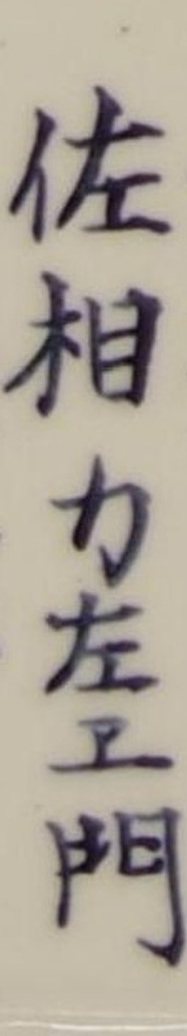佐伯力左ヱ門

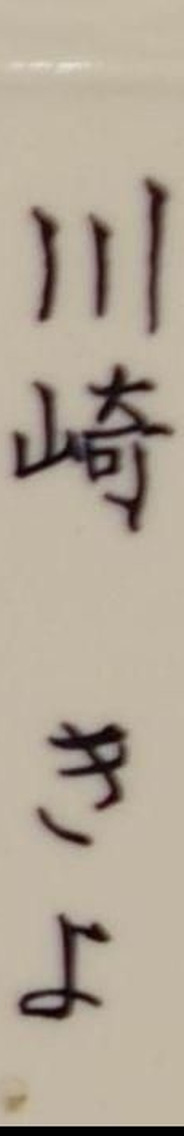川崎きよ
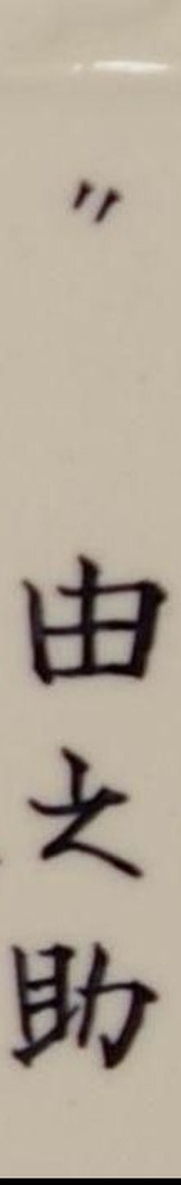由之助
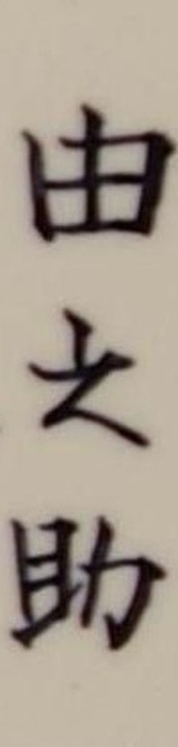由之助
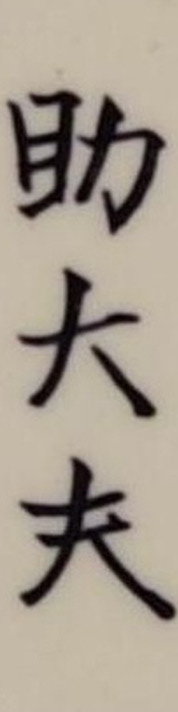助大夫
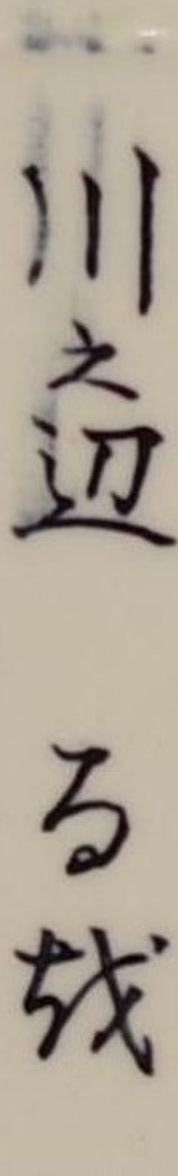川之辺るを
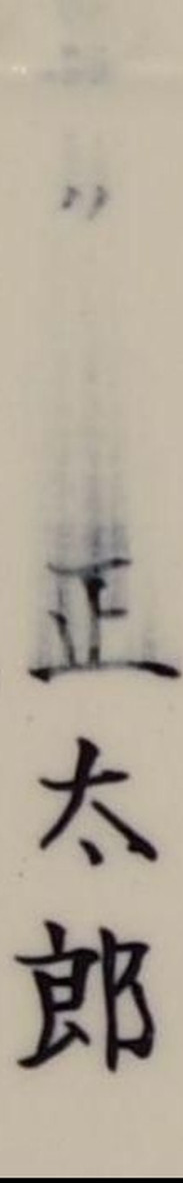正太郎
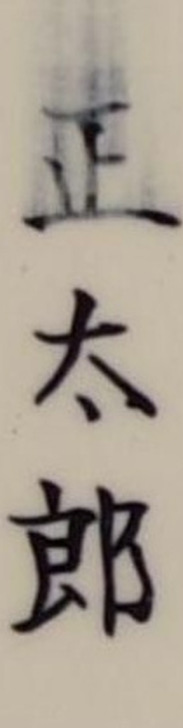正太郎
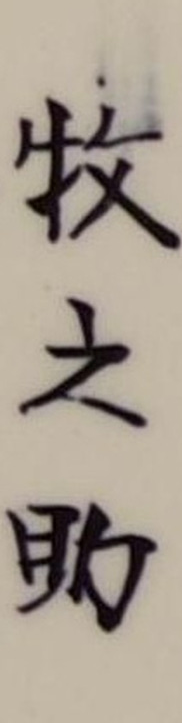牧之助
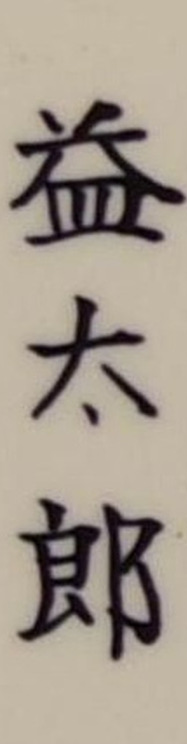益太郎
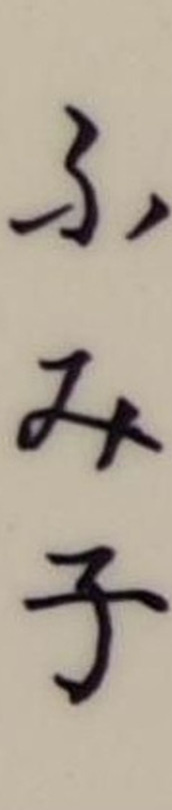ふみ子
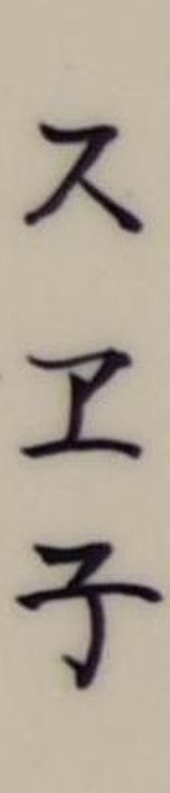スエ子
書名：M~S
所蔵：高野山金剛峯寺
